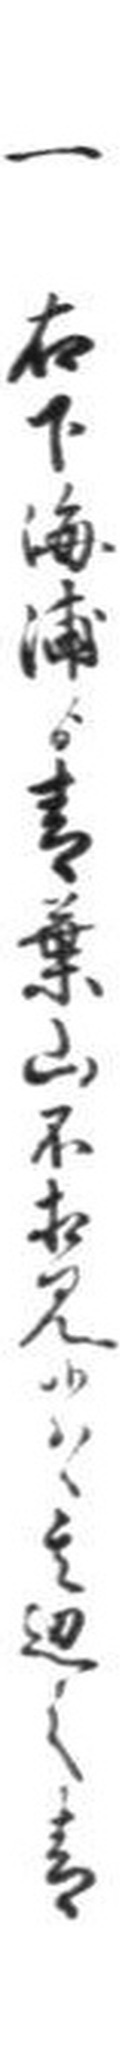一右下海浦ゟ青葉山不相見候ハヽ其辺之青
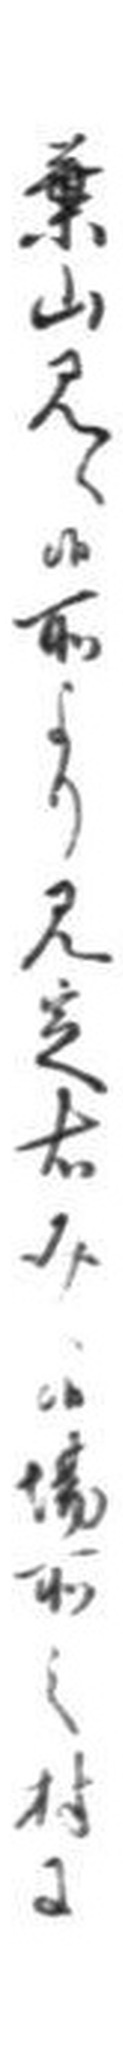葉山見へ候所より見定右みへ候場所之村に
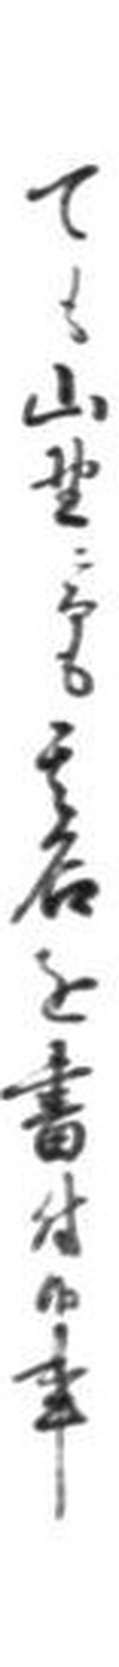ても山野ニ而も其名を書付候事
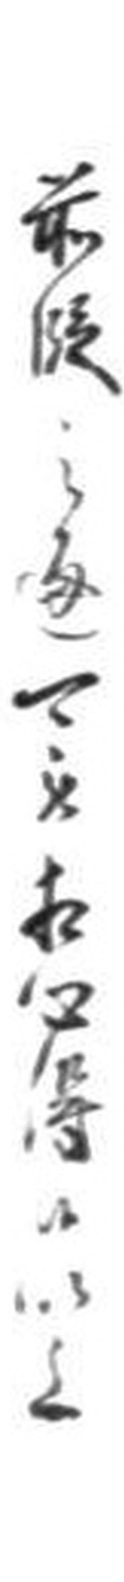前段之通可被相心得候以上
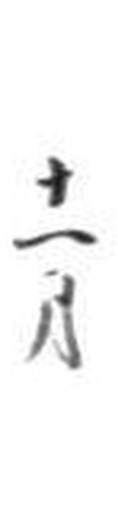十一月
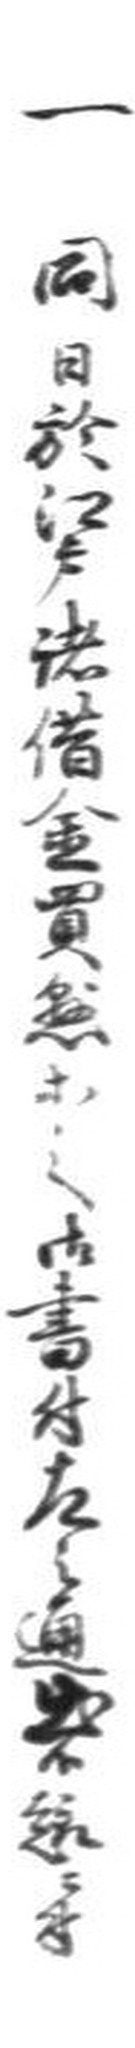一同日於江戸諸借金買懸等之御書付左之通出候趣ニ付

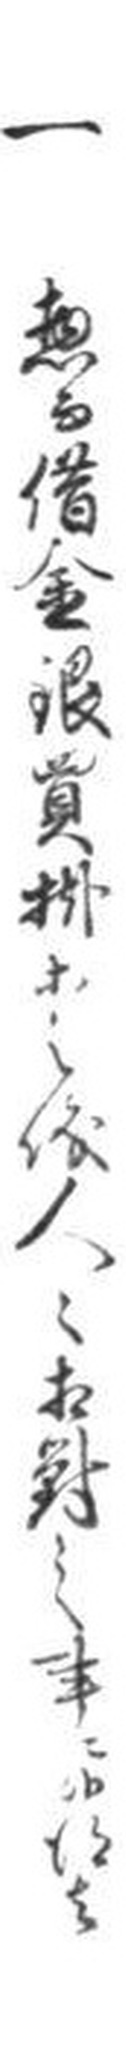一惣而借金銀買掛等之儀人々相対之事ニ候得者
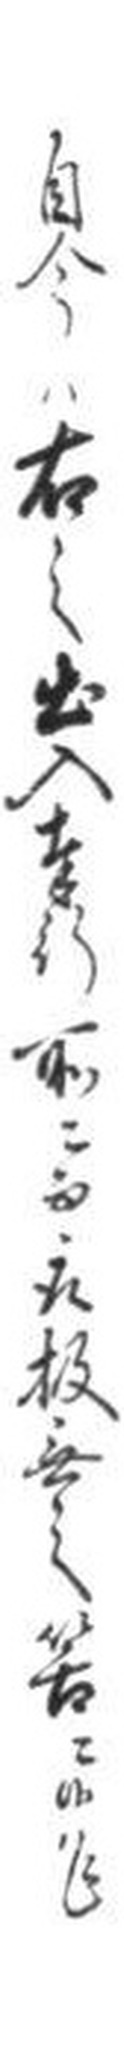自今ハ右之出入奉行所ニ而取扱無之筈ニ候乍
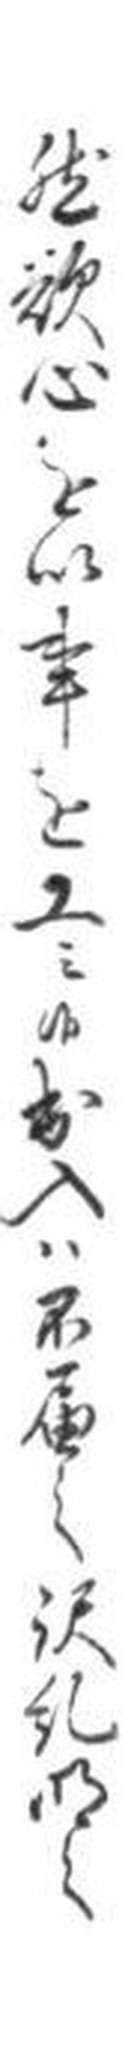然欲心を以事を工ミ候出入ハ不届之訳糺明之
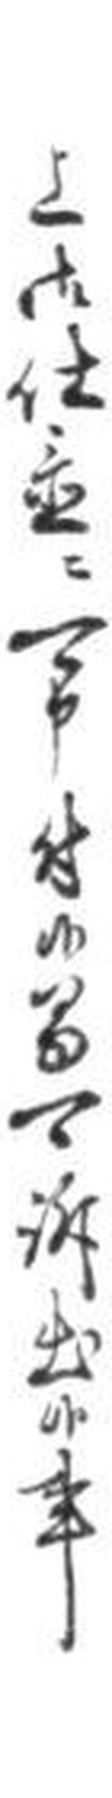上御仕置ニ可申付候間可訴出候事
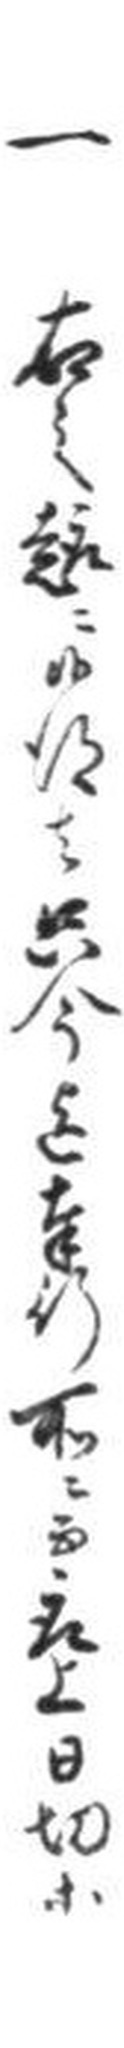一右之趣ニ候得者只今迄奉行所ニ而取上日切等
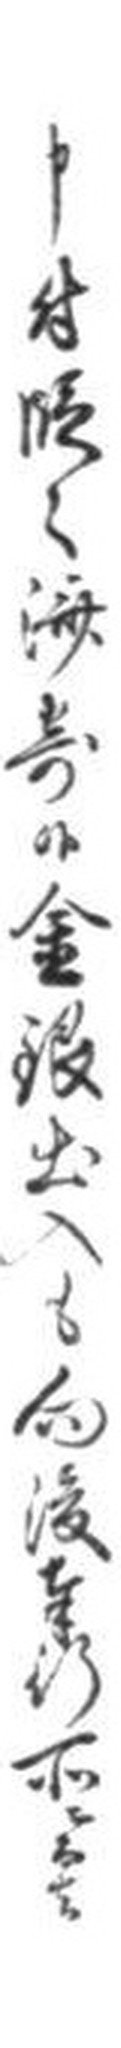申付段々済寄候金銀出入も向後奉行所ニ而者
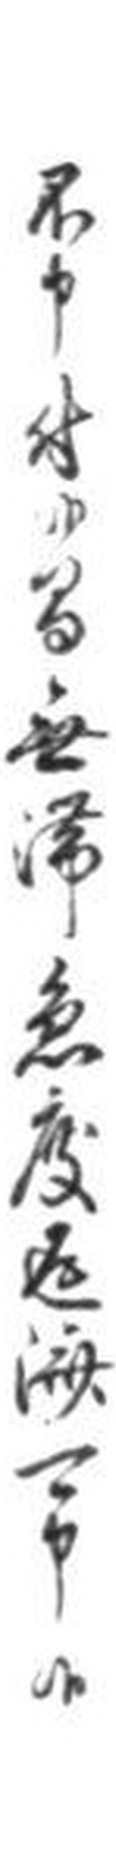不申付候間無滞急度返済可申候
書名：家譜 三十三 吉邦公 享保四年
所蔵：福井県文書館 Fukui Prefectural Archives
